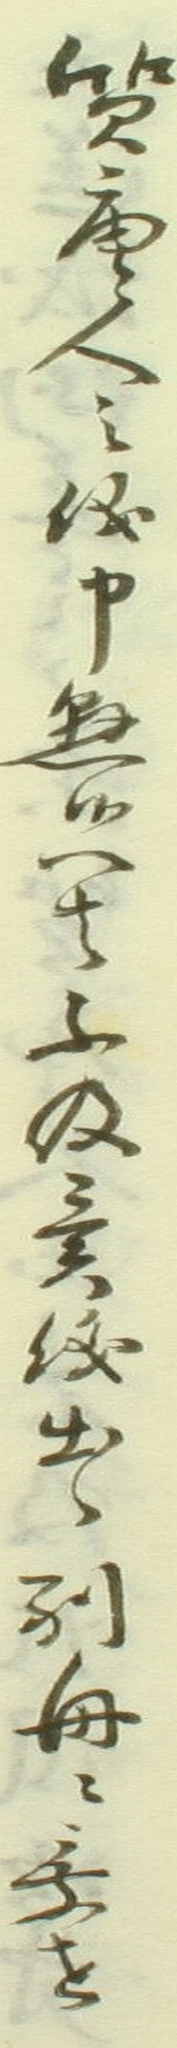質唐人之儀申懸候へは不及実儀出候別舟に乗せ
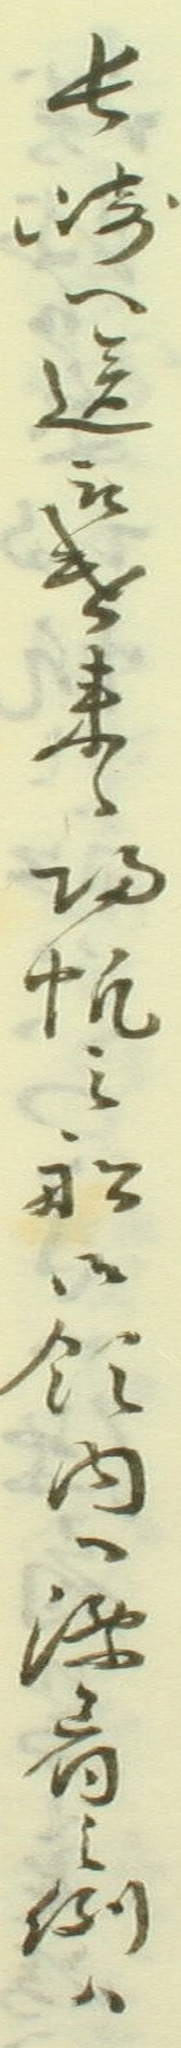長崎へ送被遣来候帰帆之船御領内へ漂着之例は
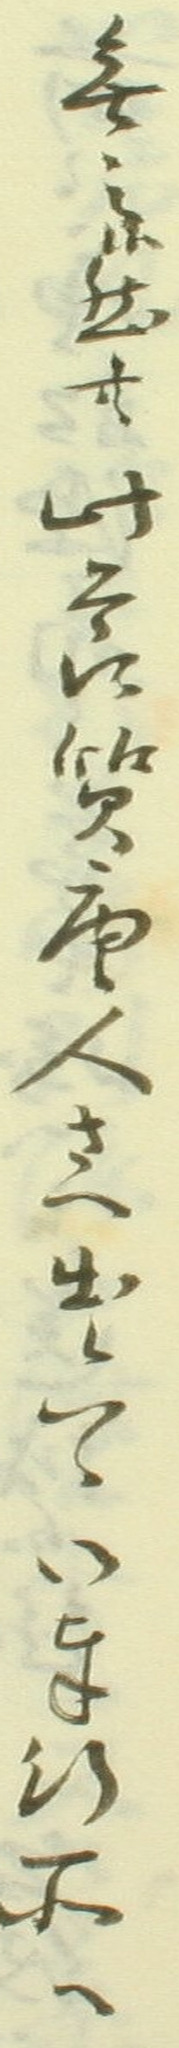無之候然共此節質唐人さへ出候はゝ御奉行所へ
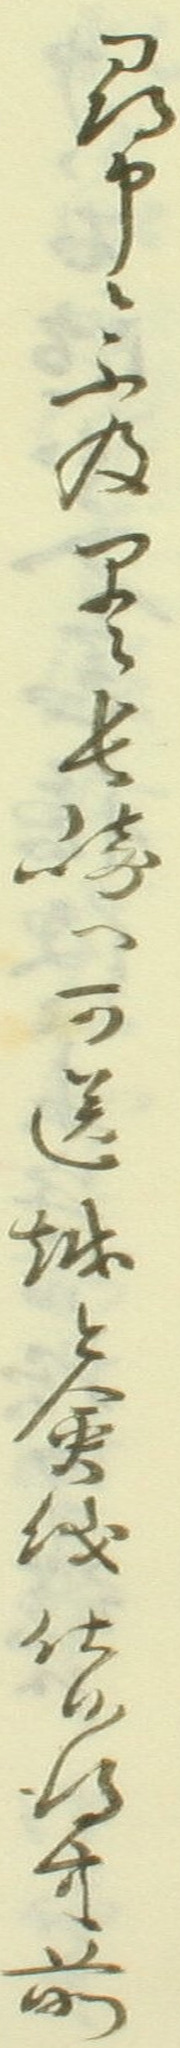尋申に不及早々長崎へ可送越と僉議仕候得共前
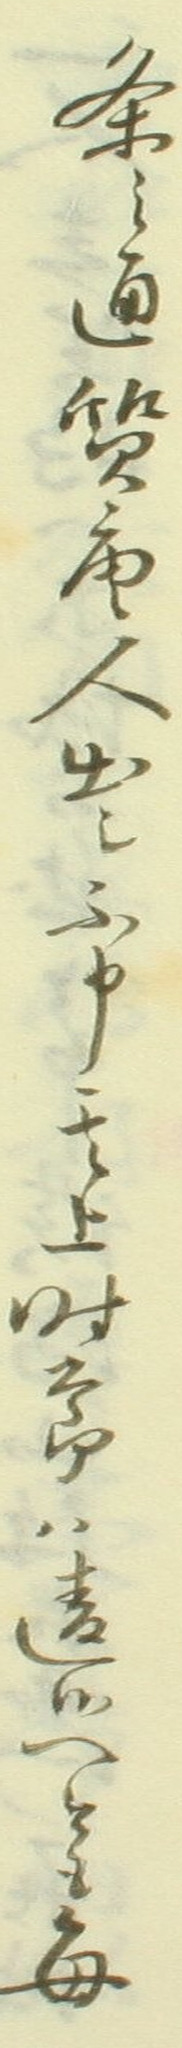条之通質唐人出し不申其上時節は違候へとも毎
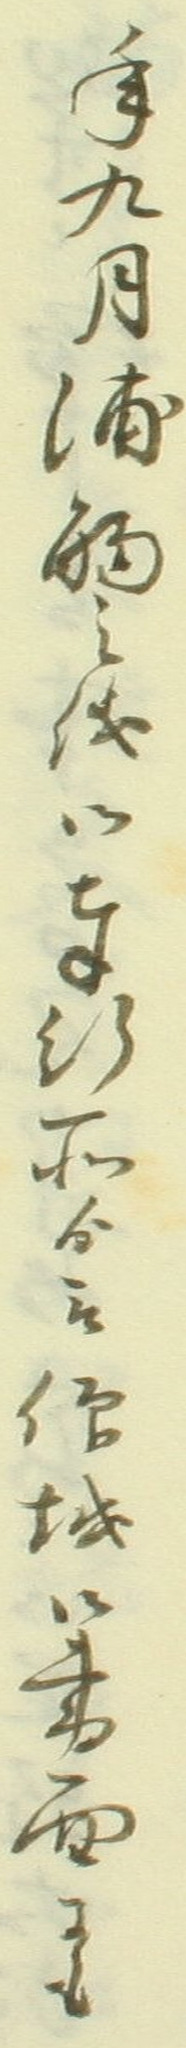年九月浦触之儀御奉行所ゟ被仰越御書面にも
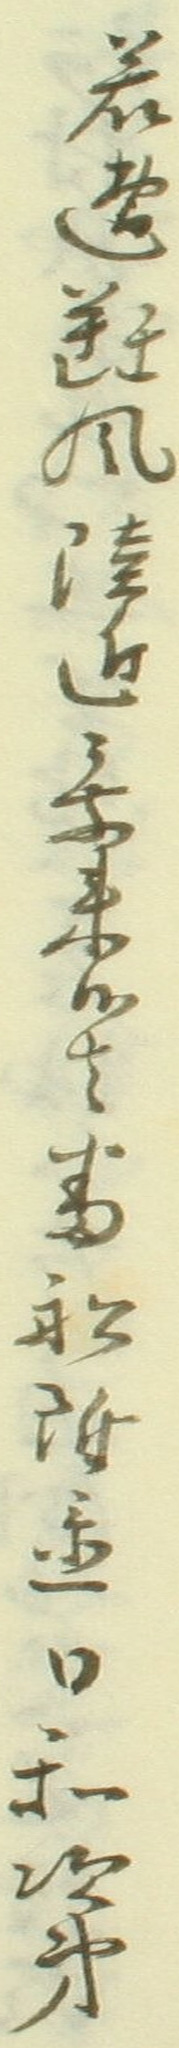若遭難風陸近に乗来候は番船附置日和次第
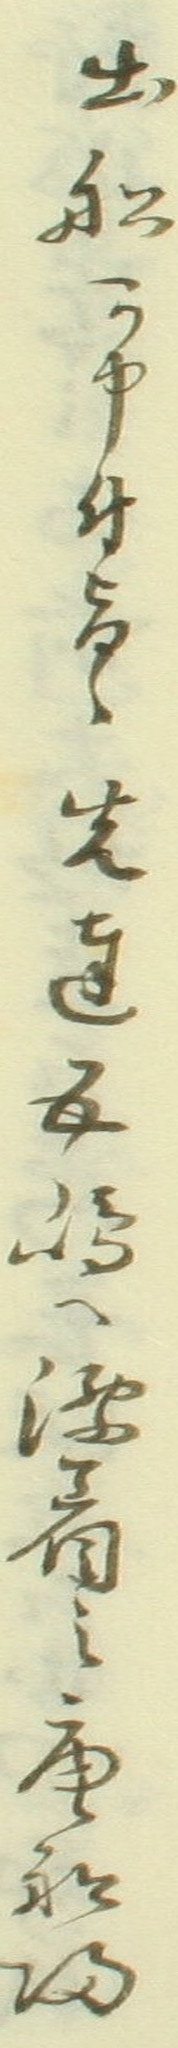出船可申付旨候先達五島へ漂着之唐船帰
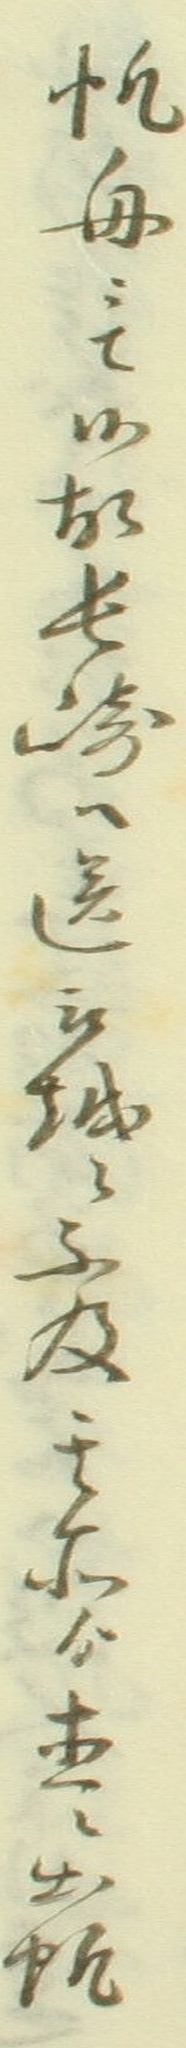帆舟にて候故長崎へ送被越に不及其所ゟ直に出帆
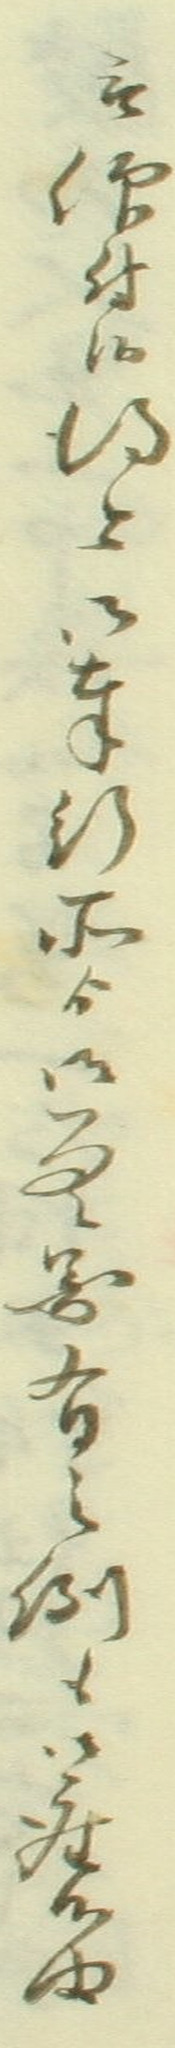被仰付候得と御奉行所ゟ御差図有之例も御座候由
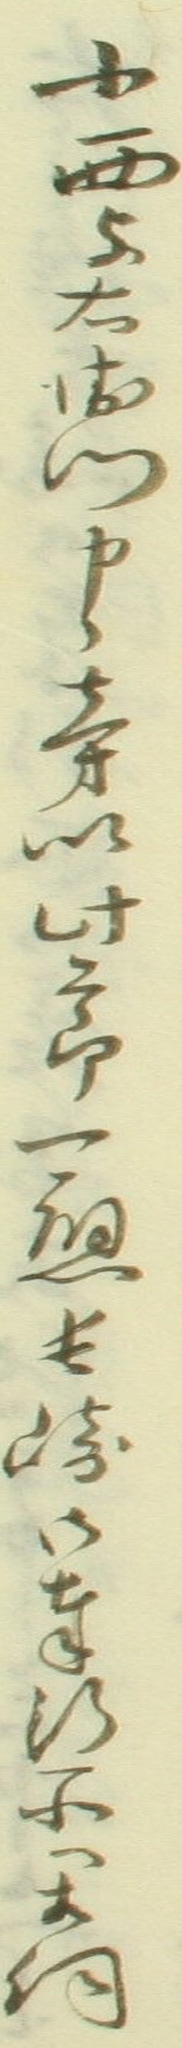小西与右衛門申候旁以此節一応長崎御奉行所へ相伺
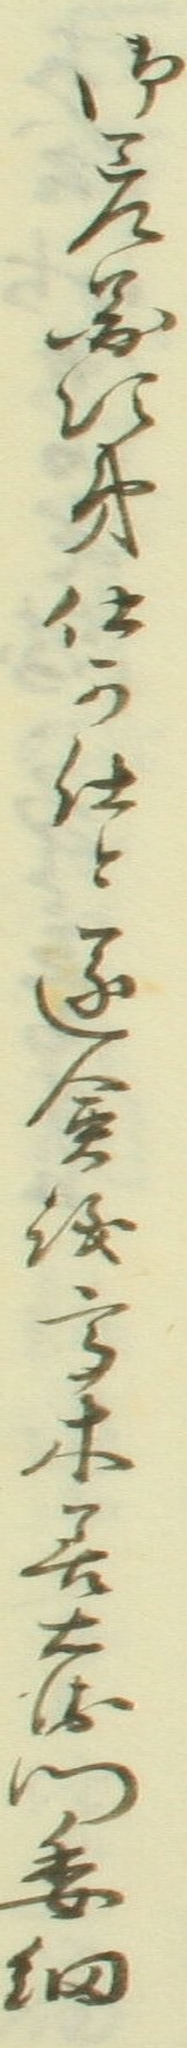御差図次第仕可仕と遂僉儀高木善右衛門委細

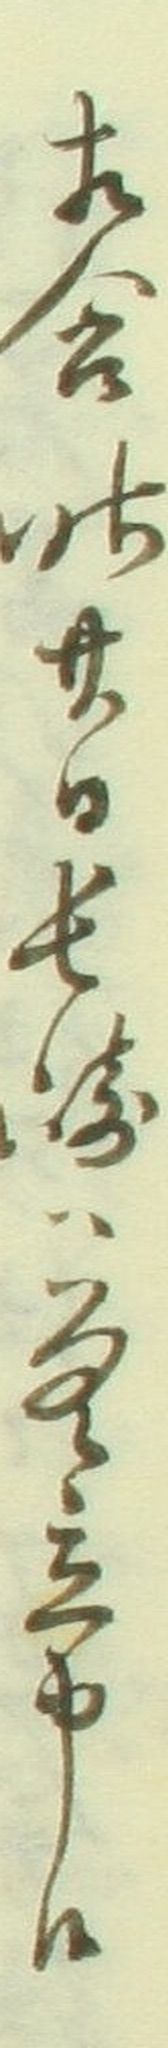相含昨廿日長崎へ差立申候
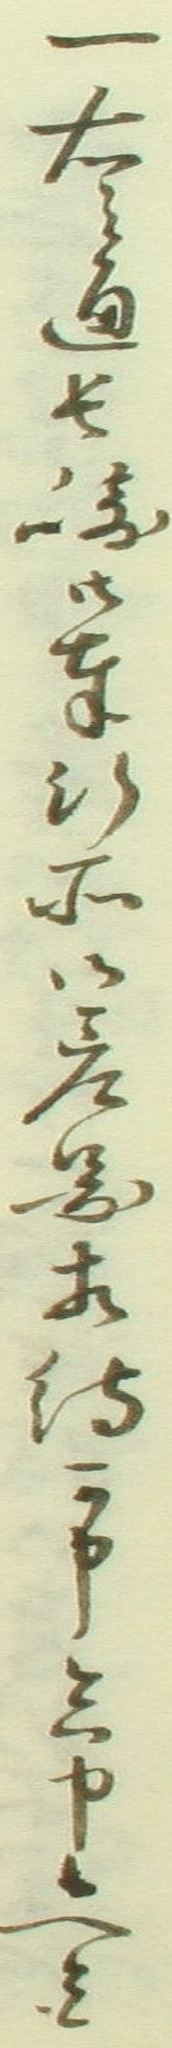一右之通長崎御奉行所御差図相待可申とは申候へとも
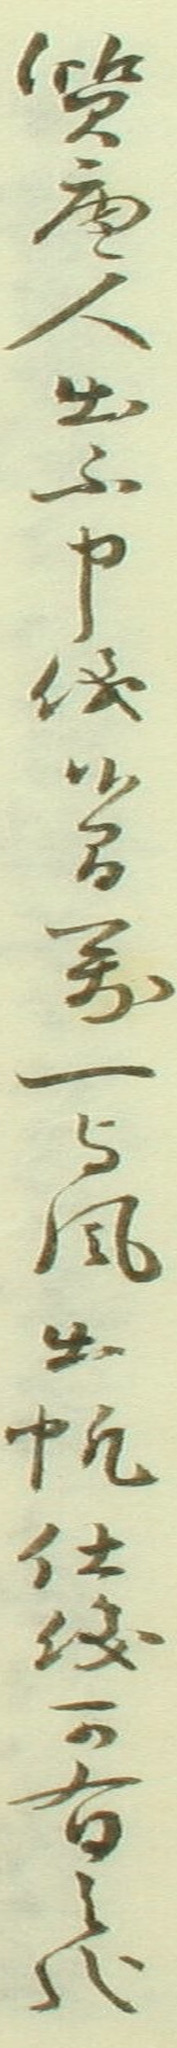質唐人出不申儀候間万一与風出帆仕儀可有之哉
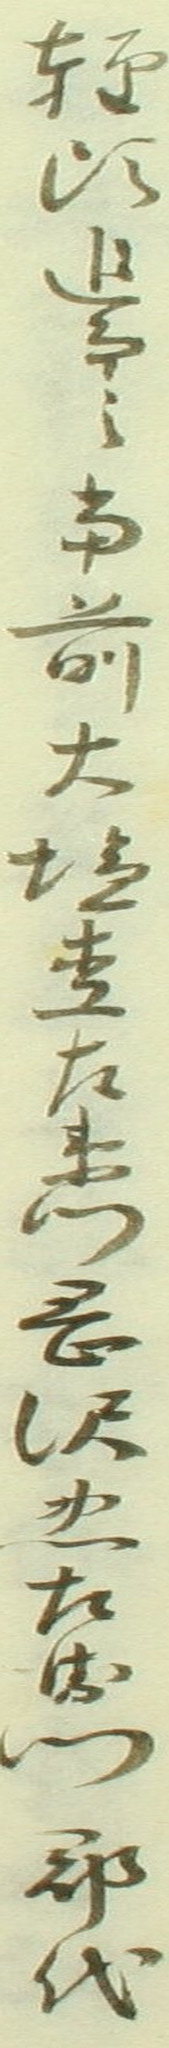軽頭追而之当前大塩杢左衛門岡沢忠左衛門郡代
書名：異国船漂着記
